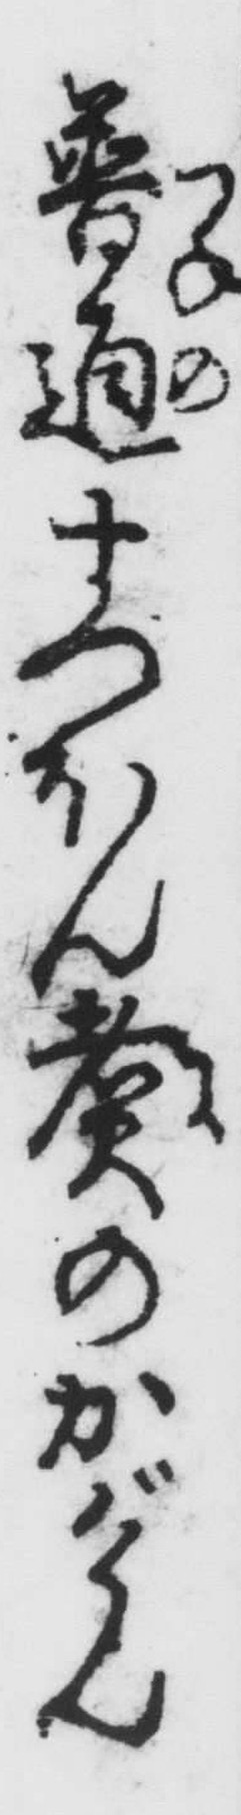普通すつほん煮のかげん
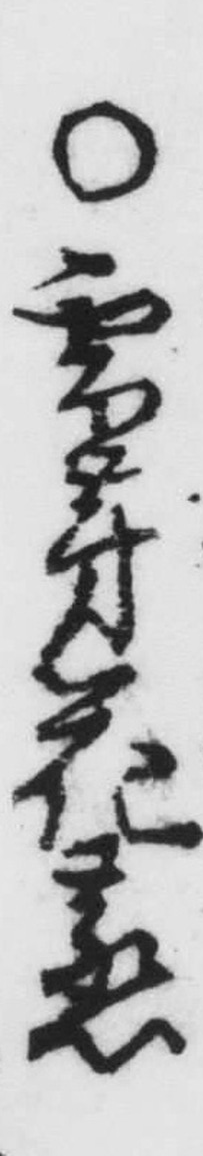○雪芽花蒸
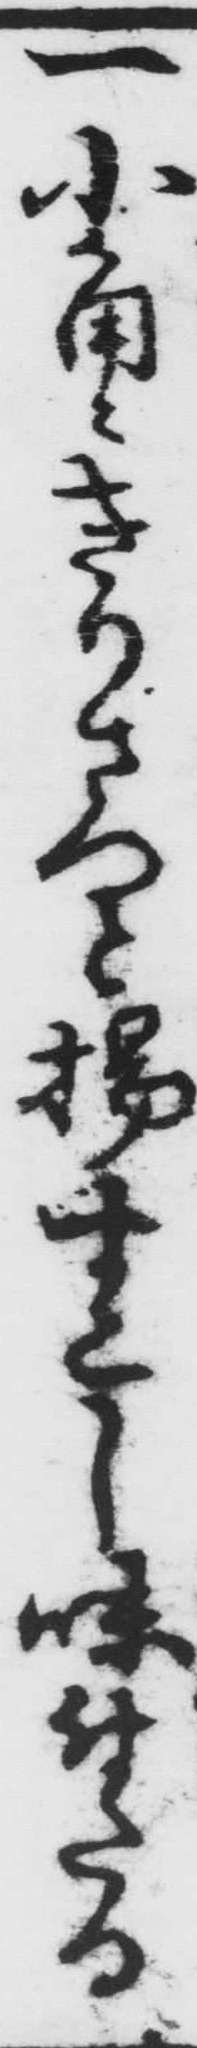一小角に切さつと揚すこし味付たる
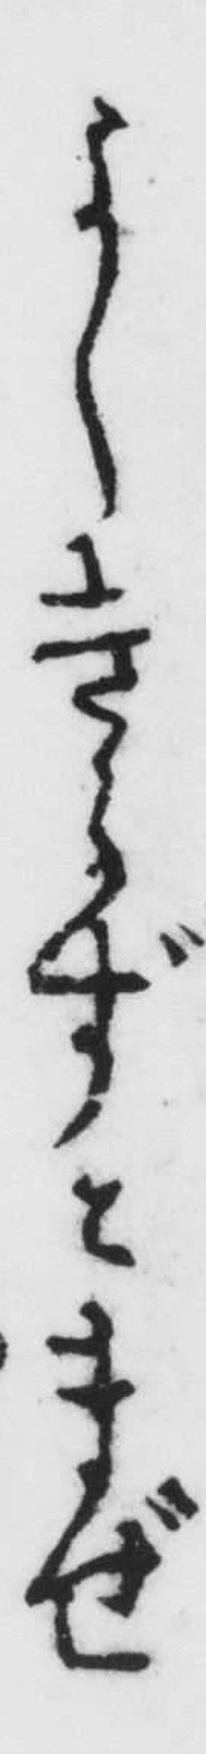よくきらずとまぜ
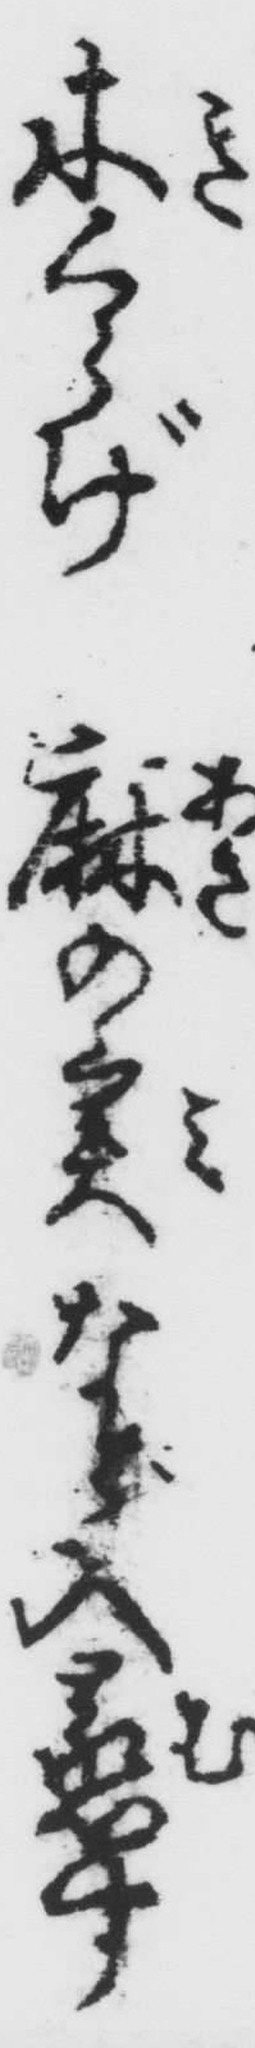木くらげ麻の実など入蒸す
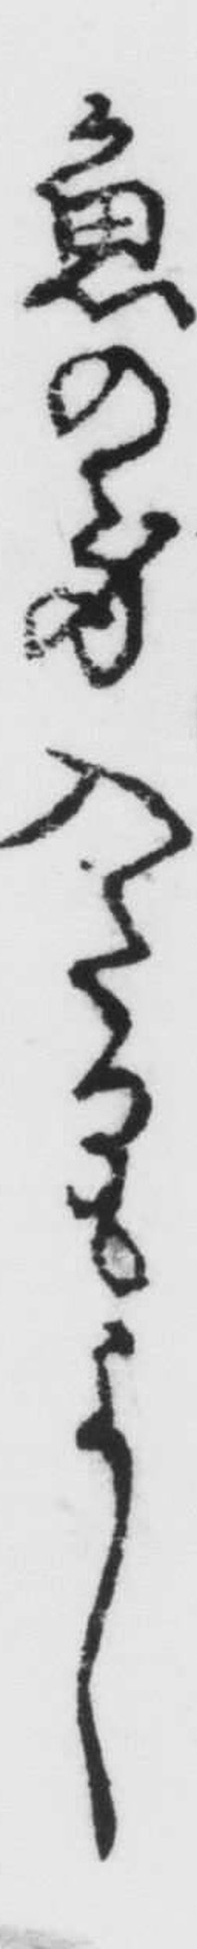魚の身入たるもよし
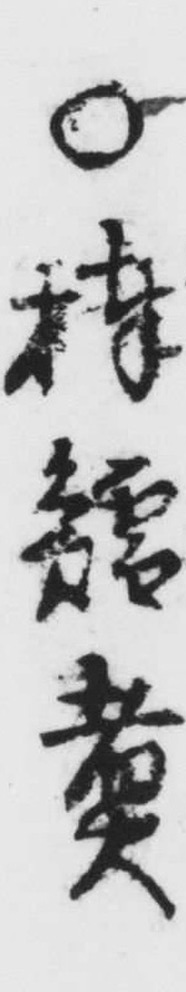○棒鱈煮
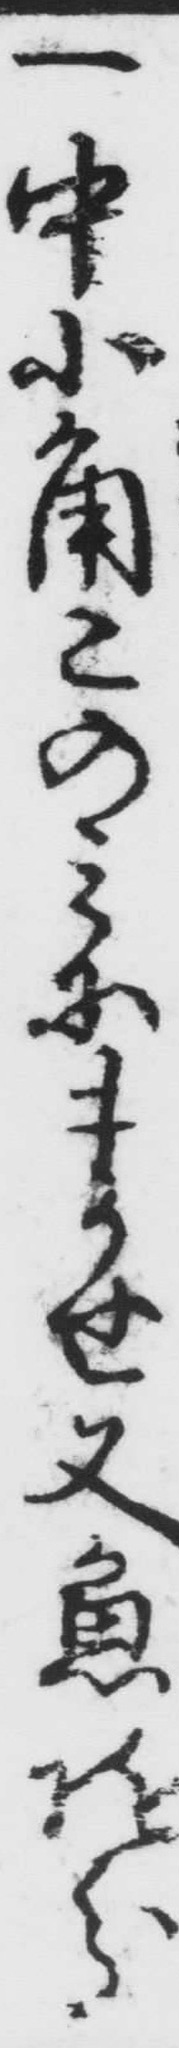一中小角このみにまかせ又魚随分
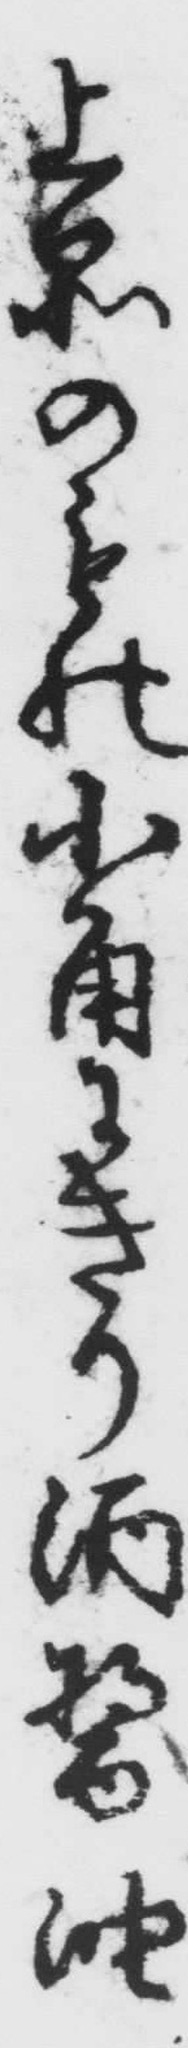上品のもの小角にきり酒醤油
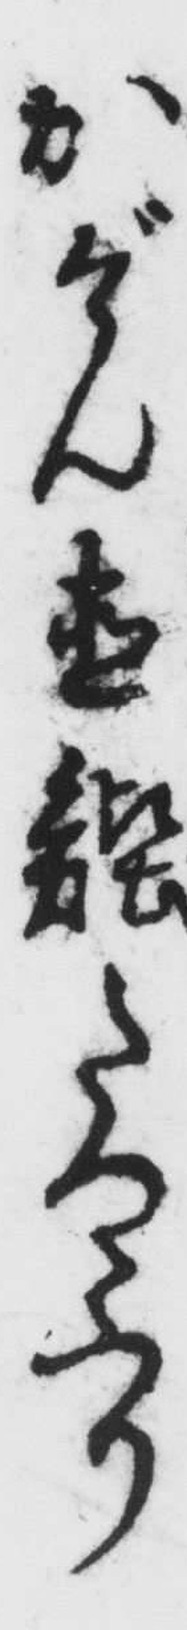かげん直鰹たつふり
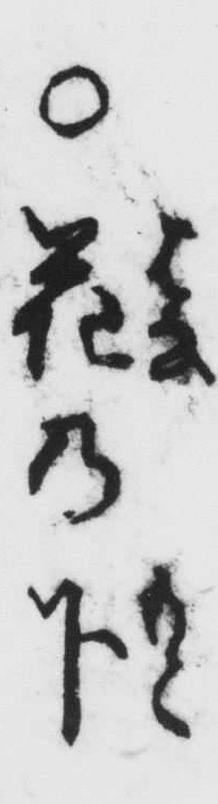○花の下
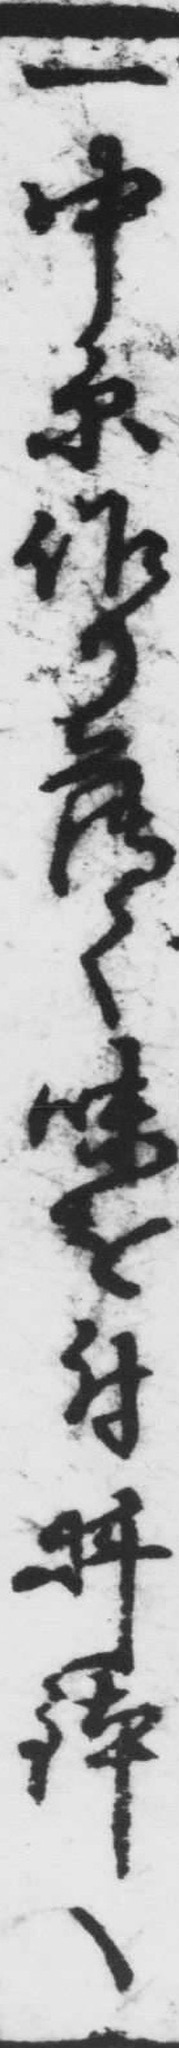一中糸作り薄く味を付丼鉢へ

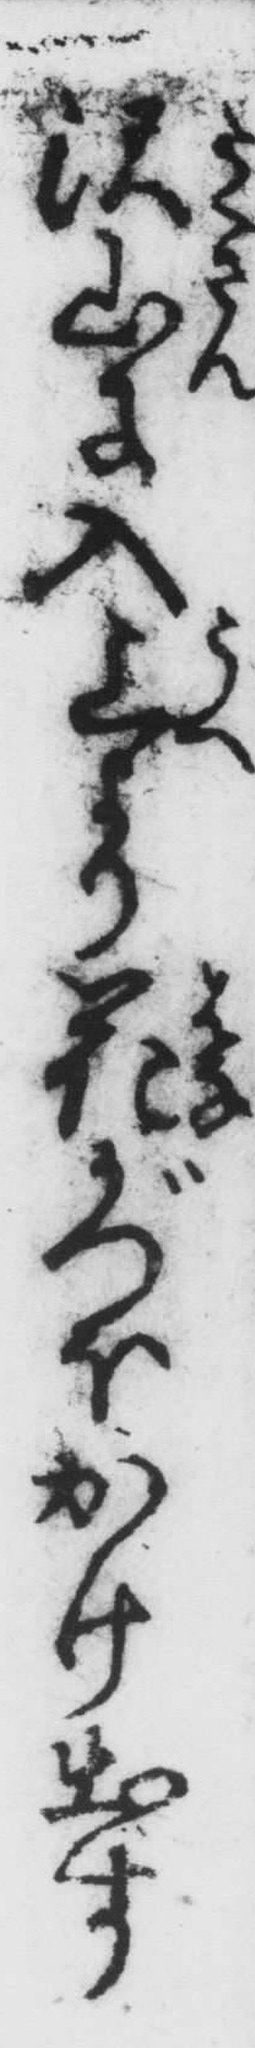沢山に入上より花がつほかけ出す
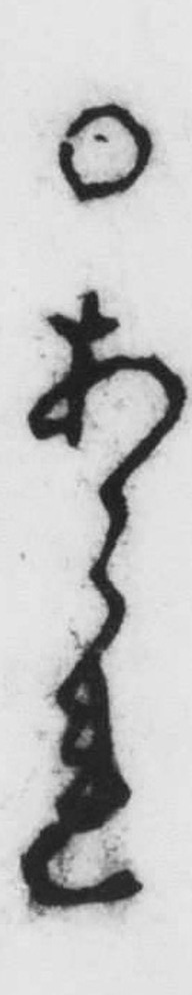○あられ
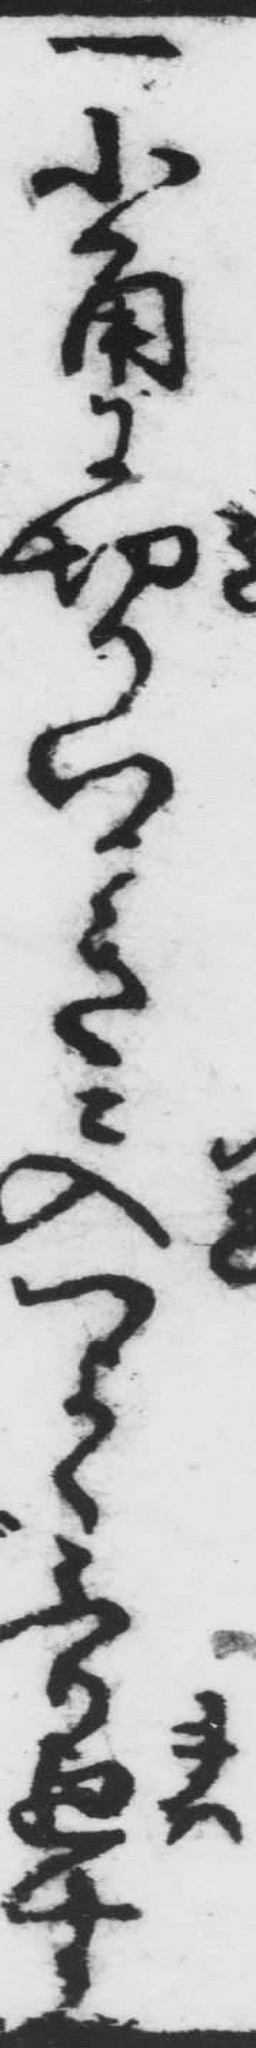一小角に切りいかきに入つよくふり廻す
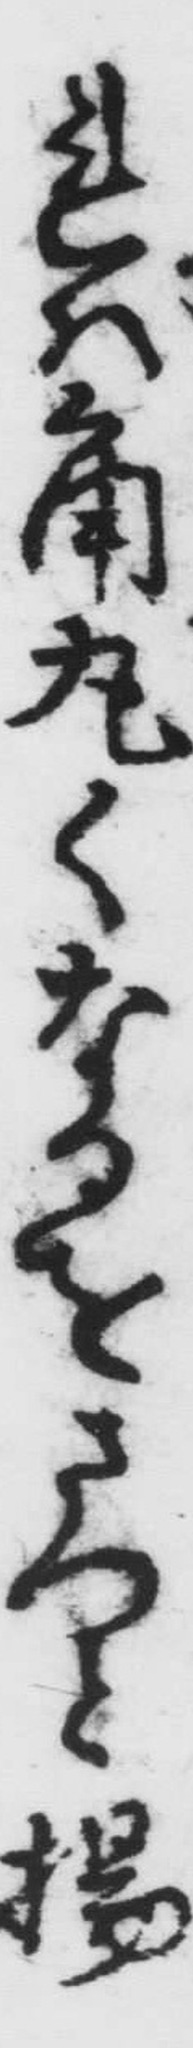れば角丸くなるをさつと揚
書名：蒟蒻百珍
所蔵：大阪府立大学学術情報センター 国文学研究資料館
